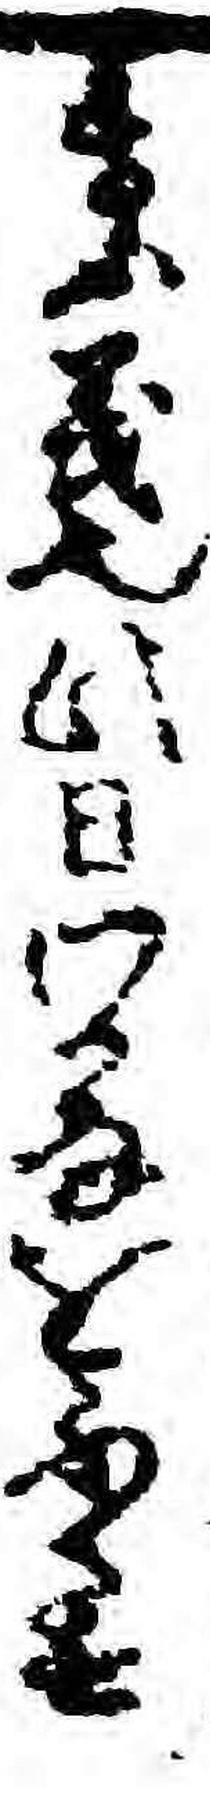まふ義也此日わかなをふくす
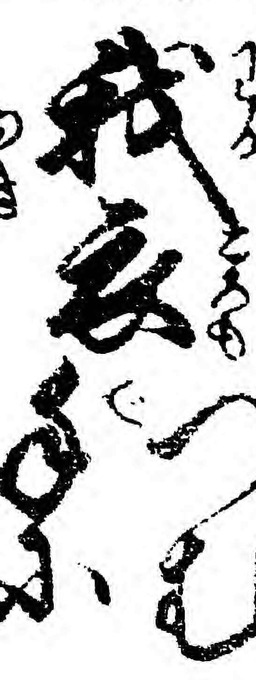我衣手に
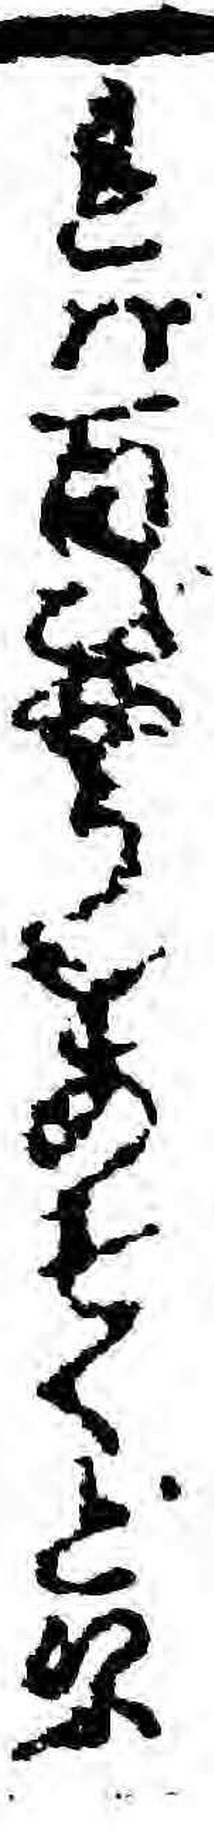れば百びやうをのぞくこといふ
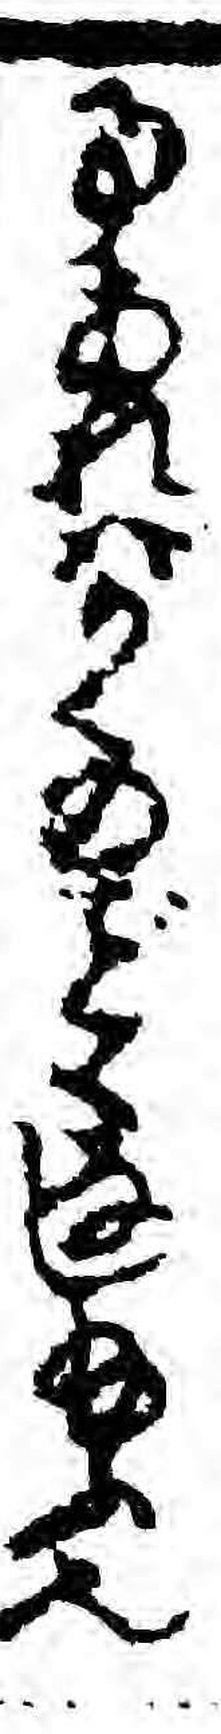事あればかくのごとくなし給ふ也
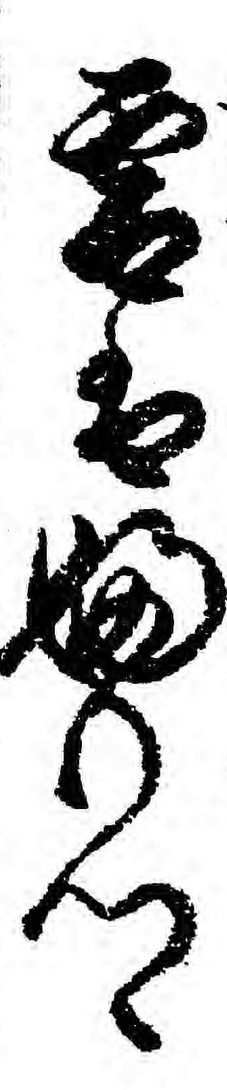雪はふりつゝ

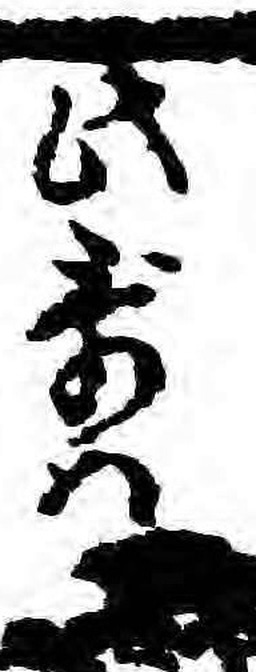此哥は
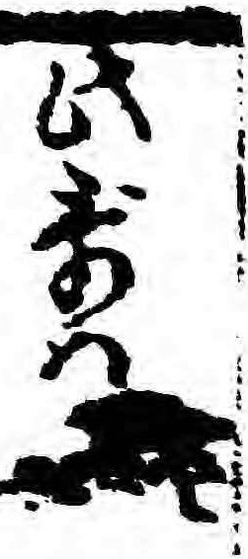此哥は
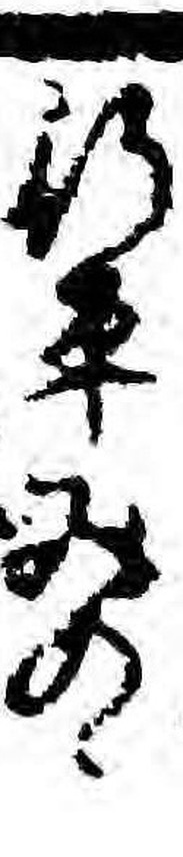行平みのゝ
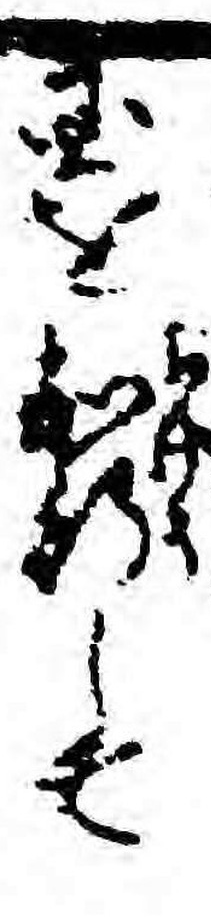国を知行して
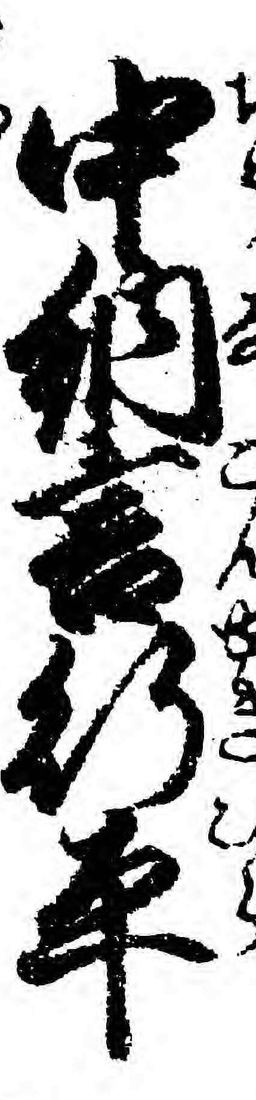中納言行平
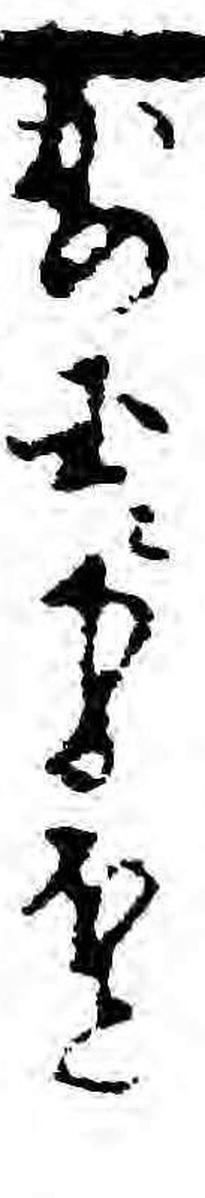かの国に下るほと
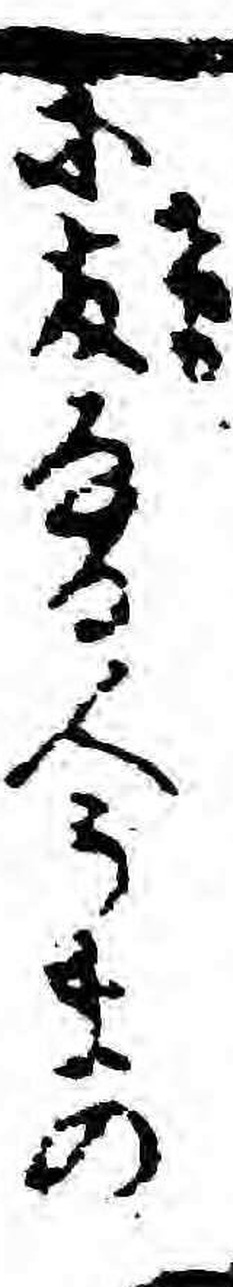に友なる人うまの
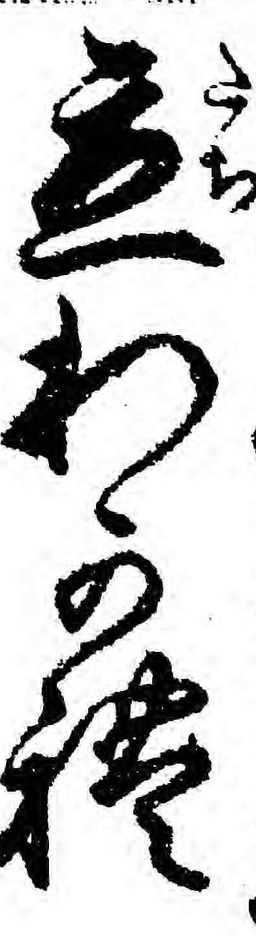立わかれ
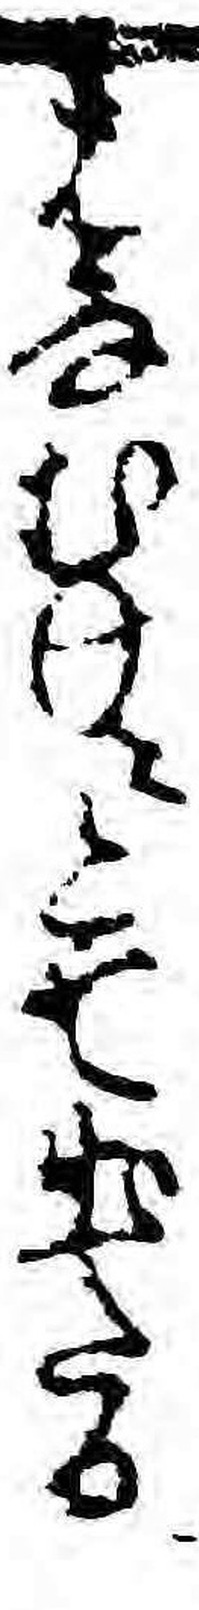はなむけにとて出たる
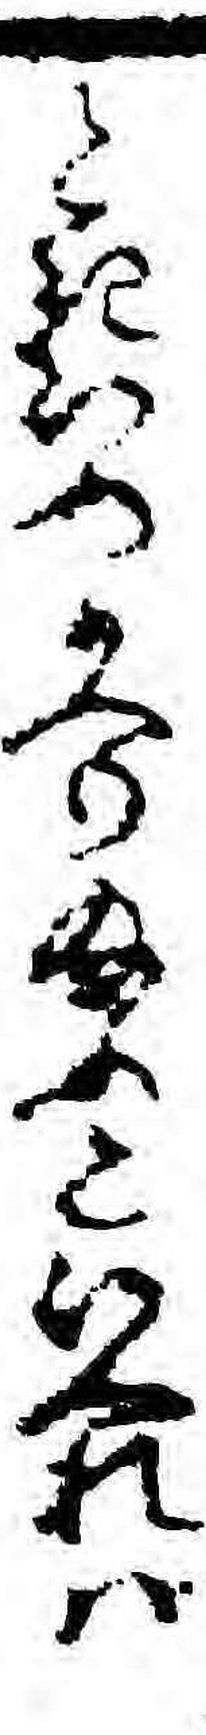ときいつかへり給ふといへれば
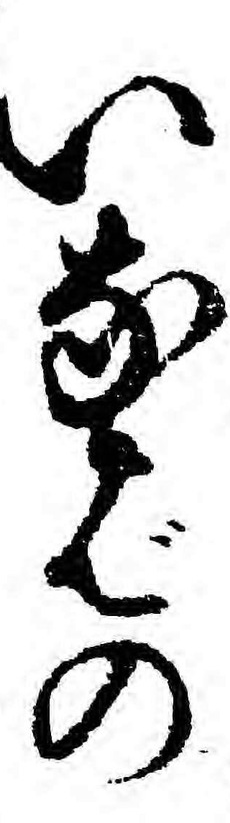いなばの
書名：頭書和歌注譯／壽賀多百人一首小倉錦
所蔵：国文学研究資料館
